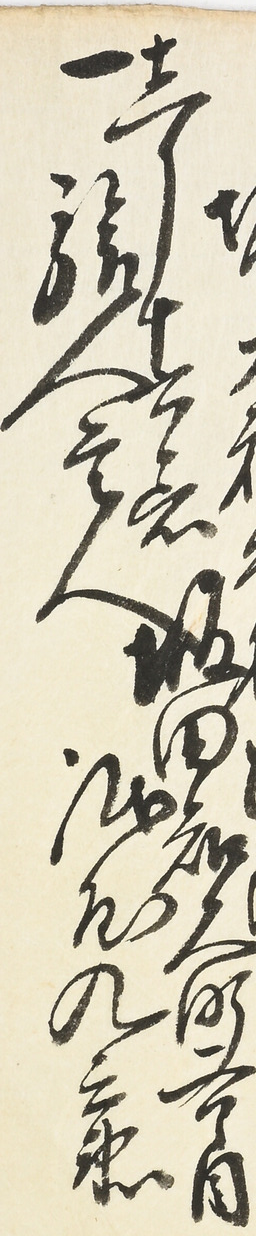一旅人壱人紙屋九兵衛
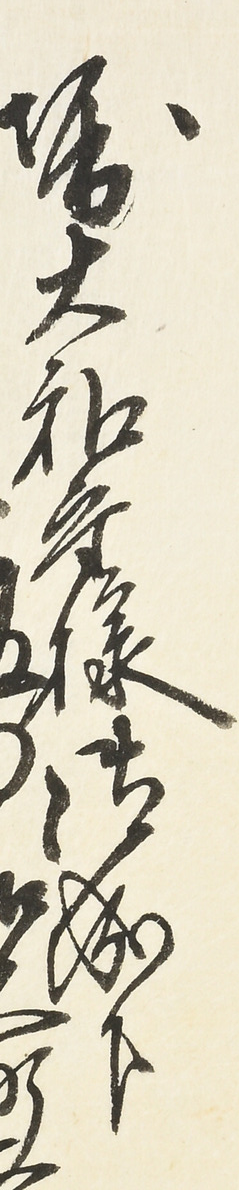堀大和守様御城下
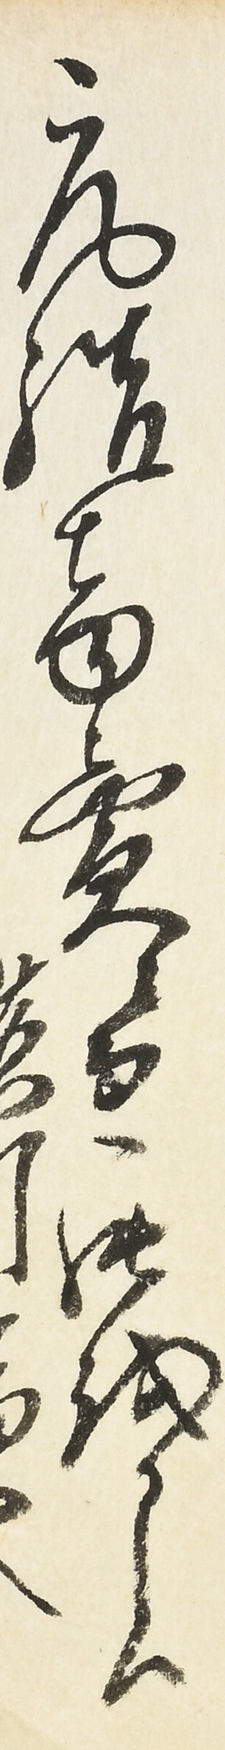取結商売ニ而罷越申候
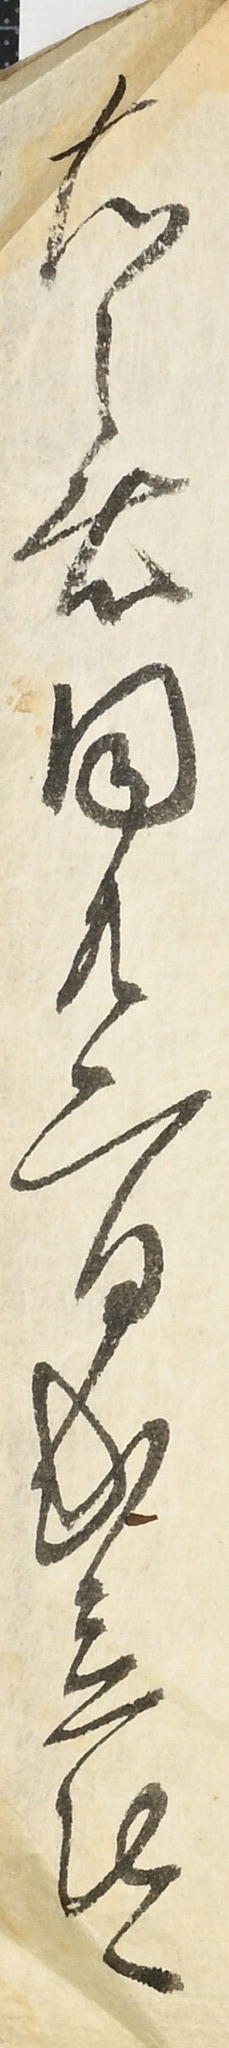右之者同廿二日出立仕候
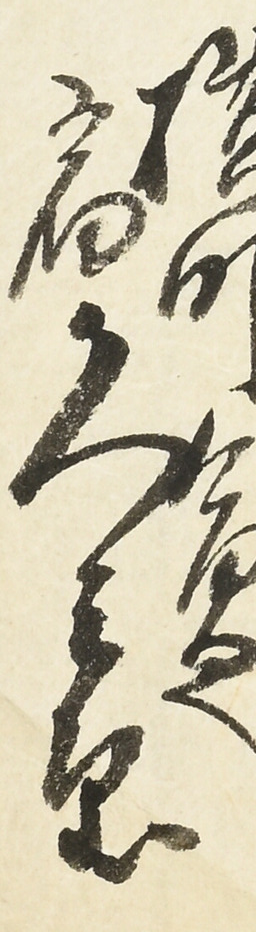宿久兵衛

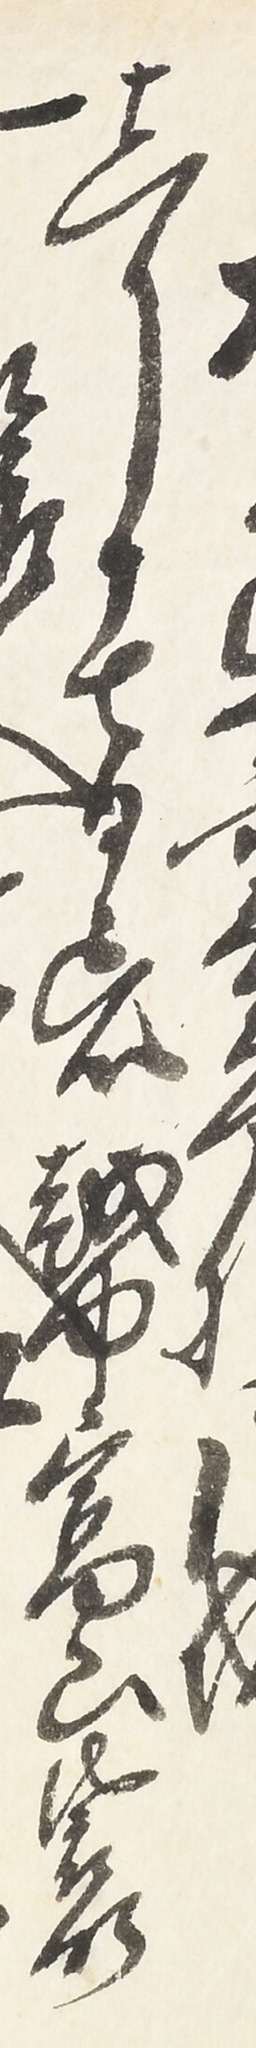十二月十七日着越中富山付袋町
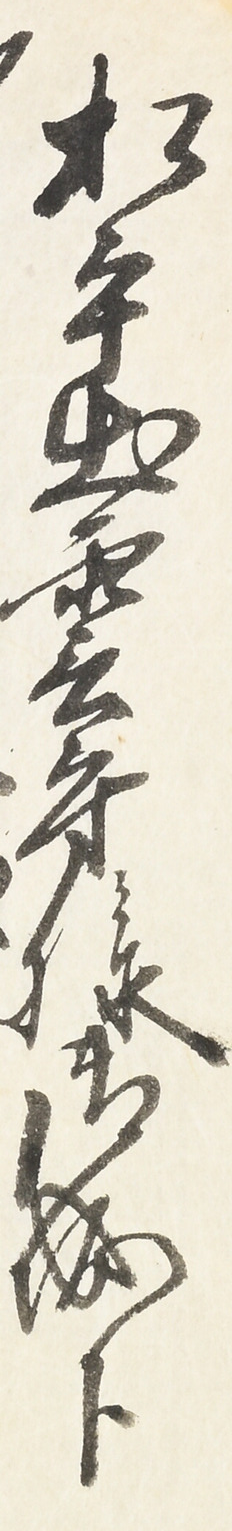松平出雲守様御城下
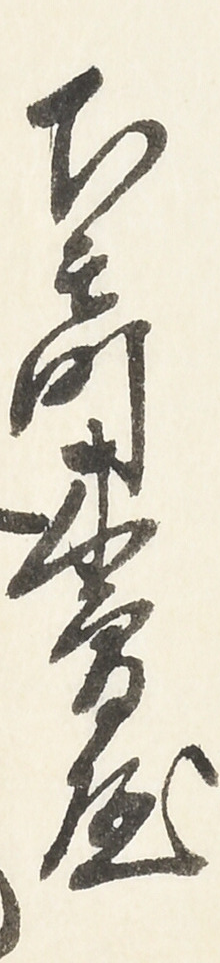下モ町木曽屋
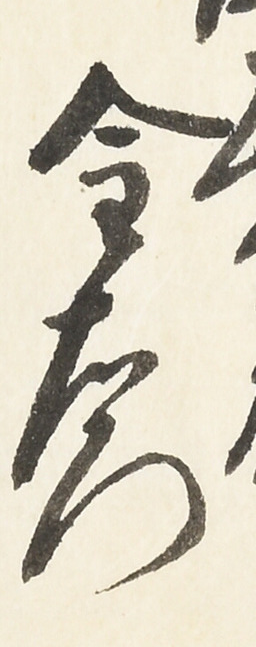金右衛門
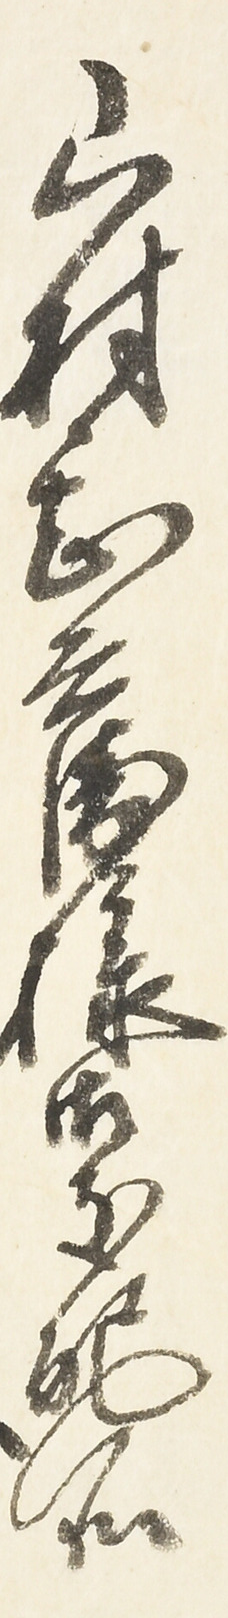山村甚兵衛様御支配所
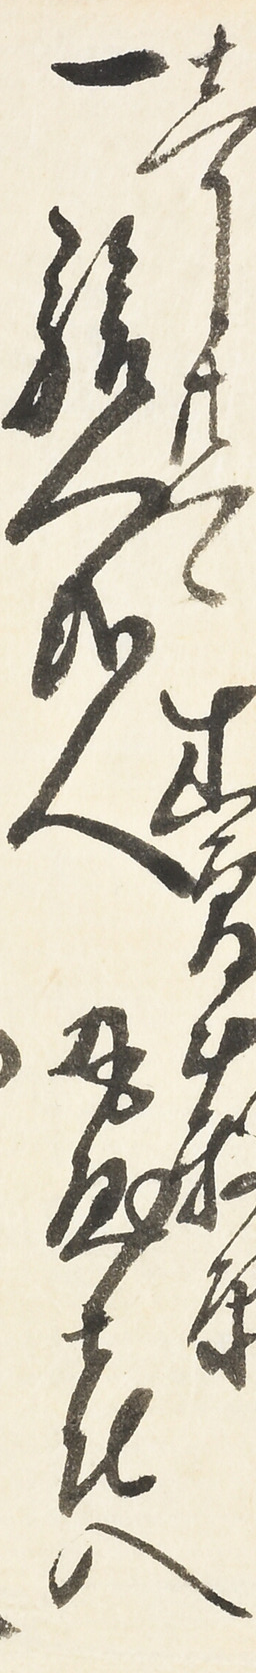一旅人弐人丸屋喜八
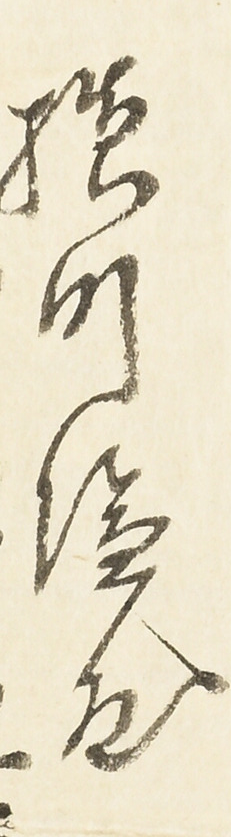横町塩屋
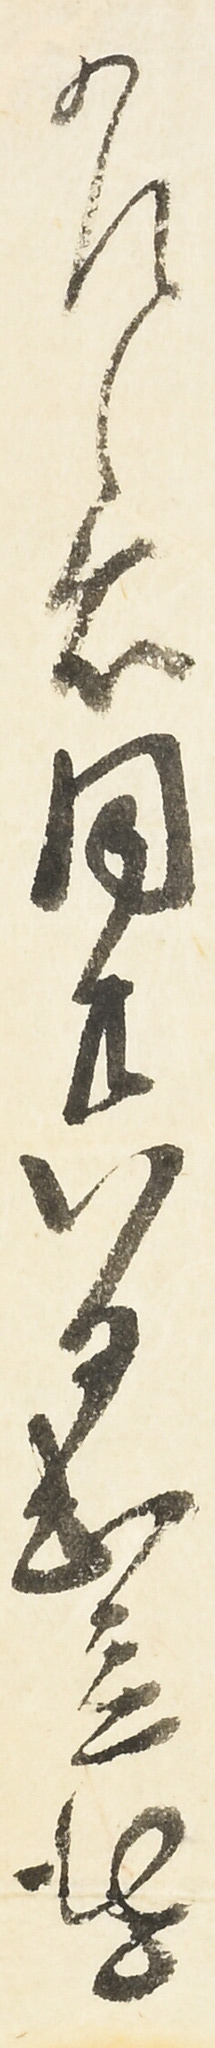右之者同廿八日出立仕候
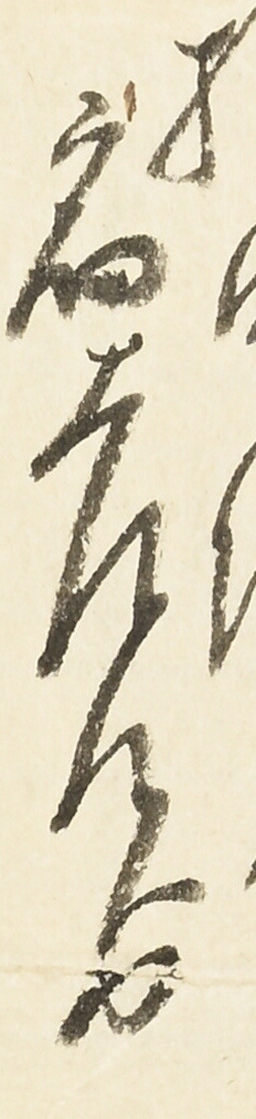宿善左衛門
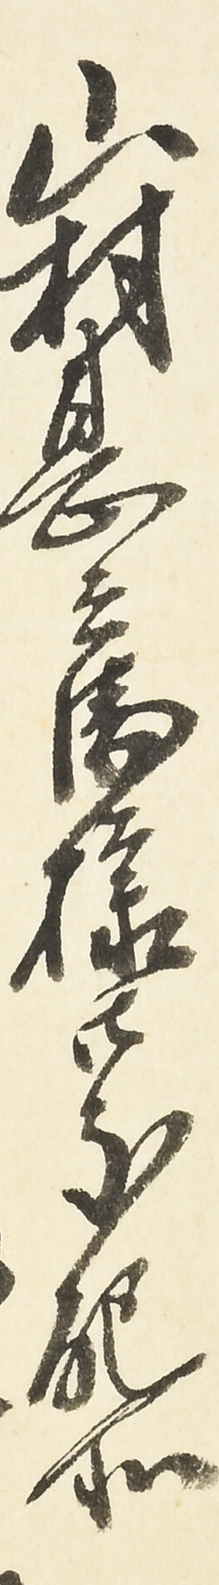山村甚兵衛様御支配所
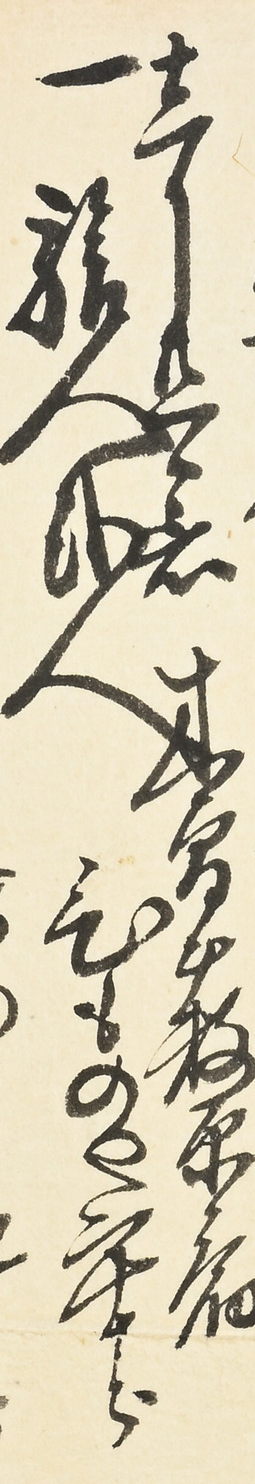一旅人弐人ひものや平十郎
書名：町中旅人泊控帳
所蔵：伊那市立高遠町図書館・合同会社AMANE
